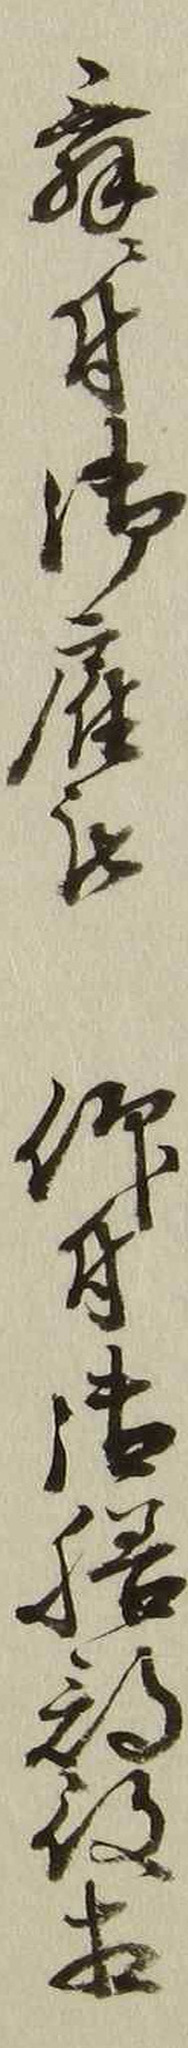舞ニ付御雇被仰付御膳役相
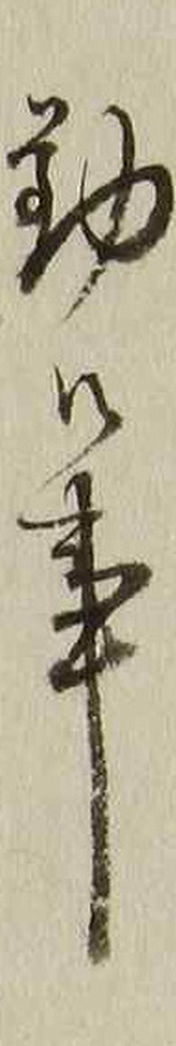勤候事
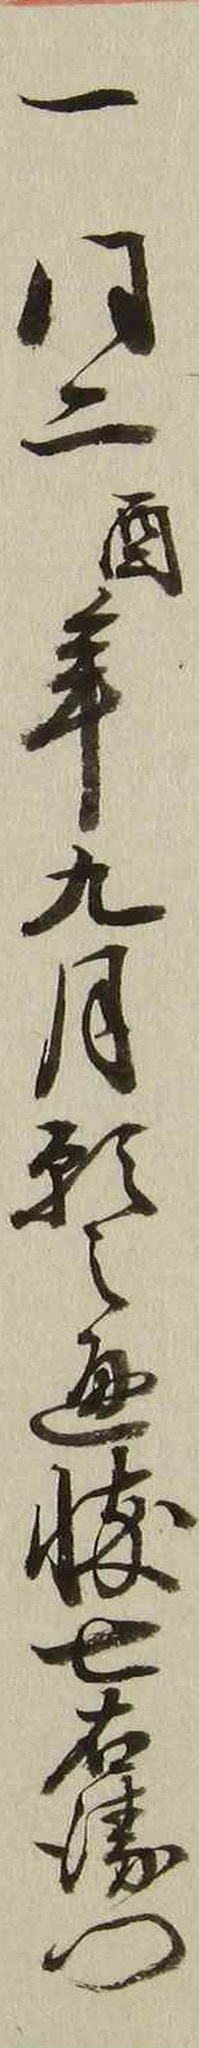一同二酉年九月願之通忰七右衛門
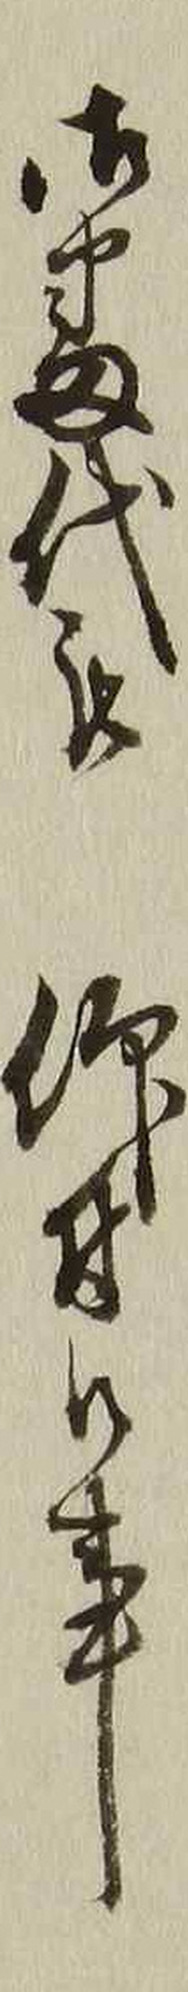御番代被仰付候事
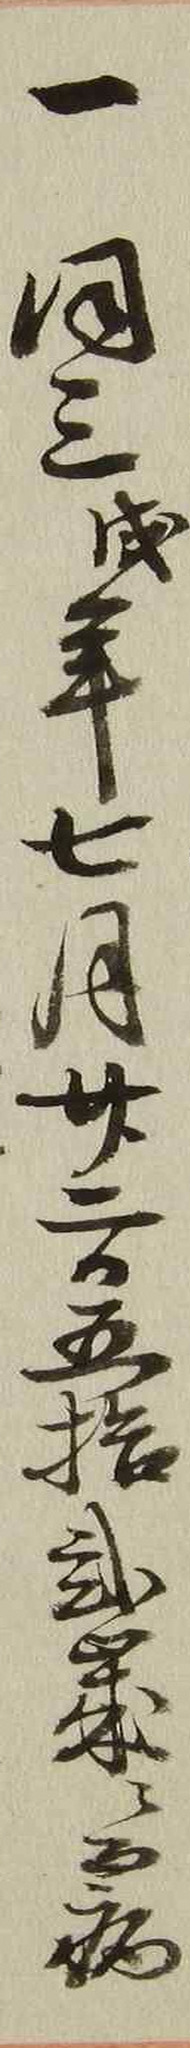一同三戌年七月廿二日五拾弐歳ニ而病
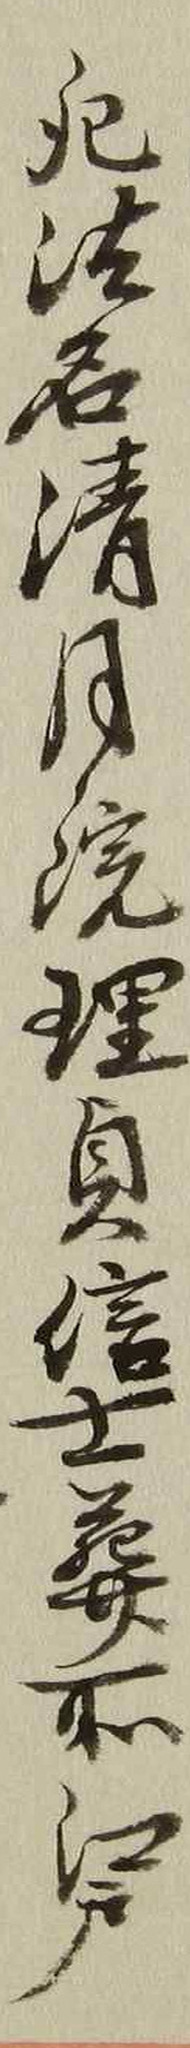死法名清月院理貞信士葬所江戸
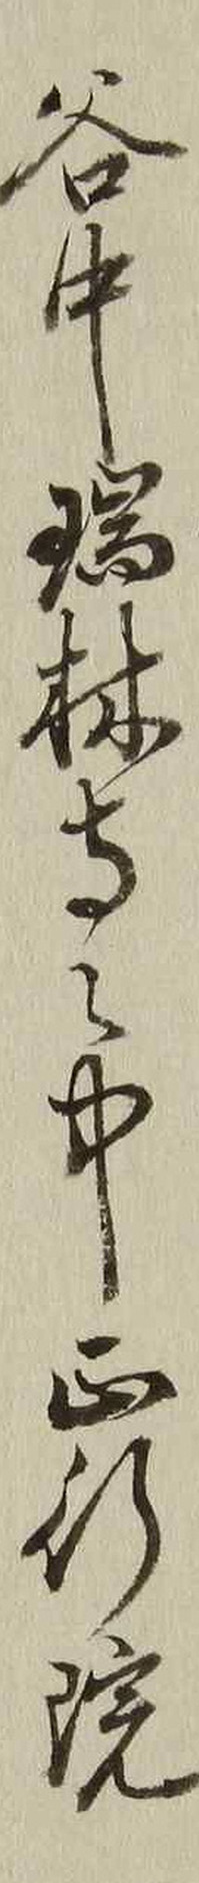谷中瑞林寺之中正行院
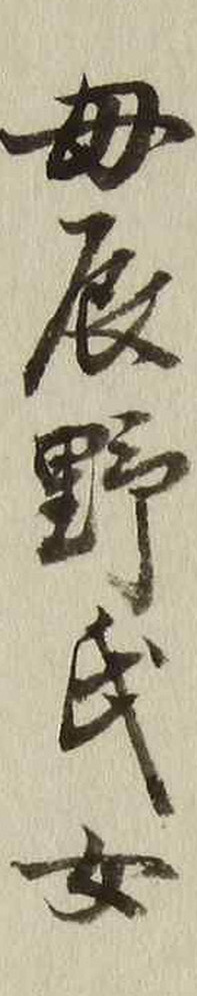母辰野氏女
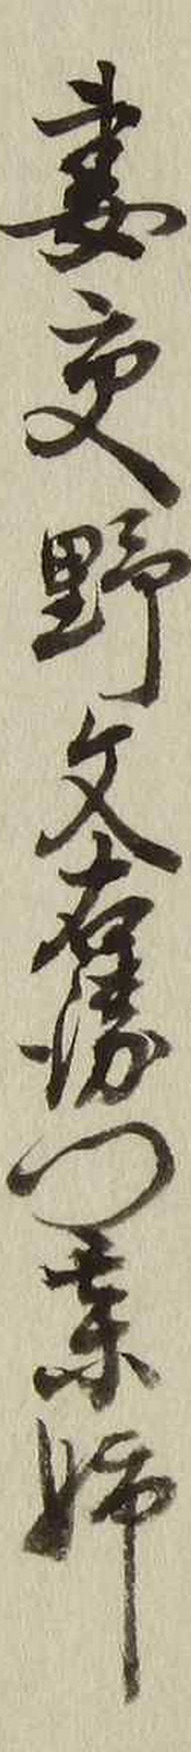妻交野文右衛門某姉
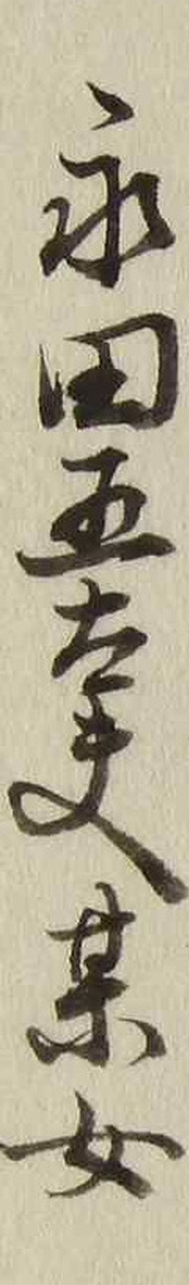永田五太夫某女
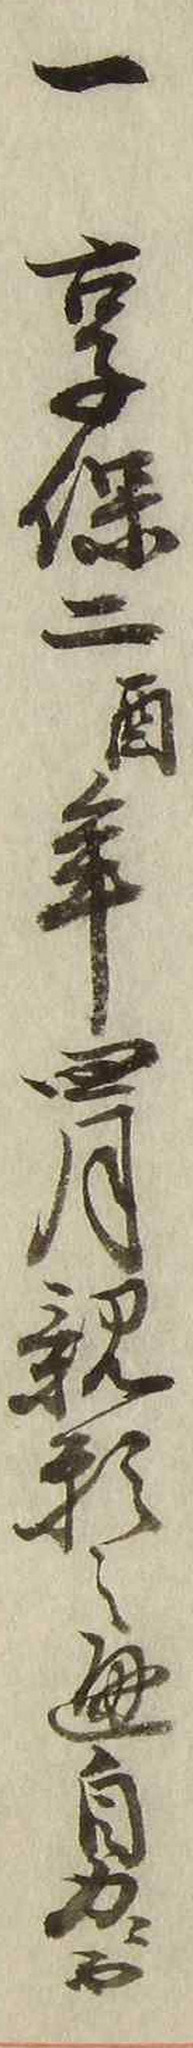一享保二酉年四月親願之通自力ニ而

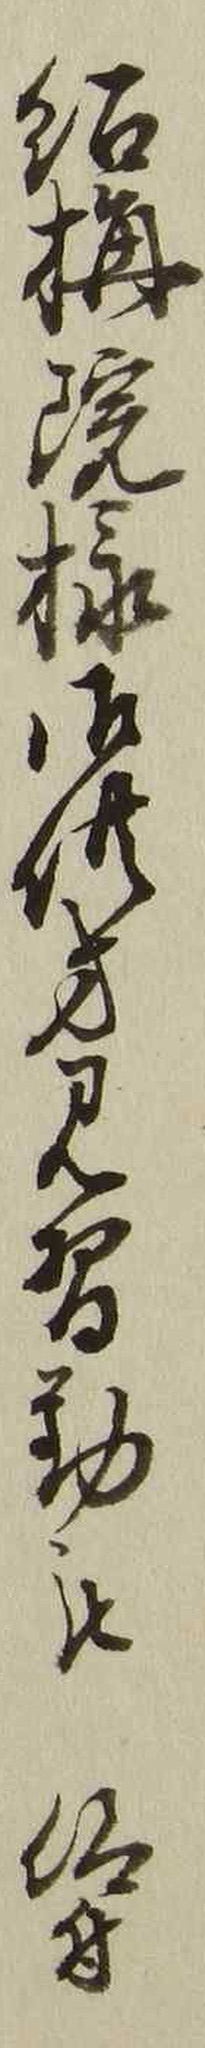紹栴院様御供方見習勤被仰付
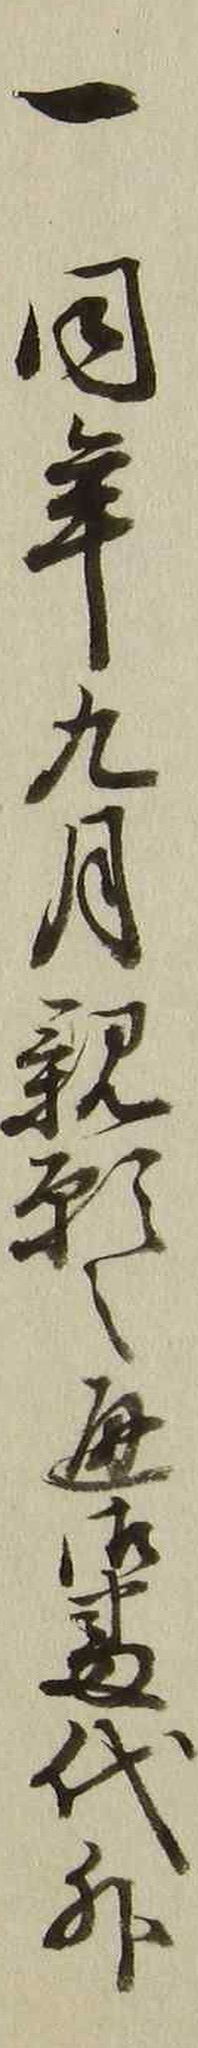一同年九月親願之通御番代外
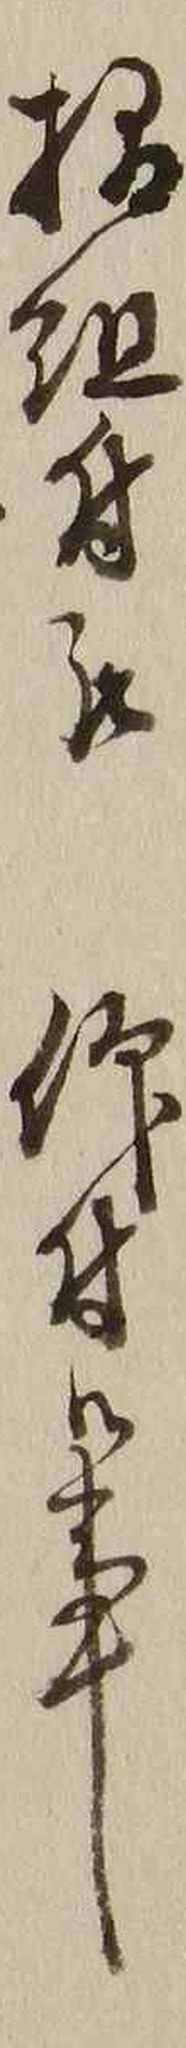様組付被仰付候事
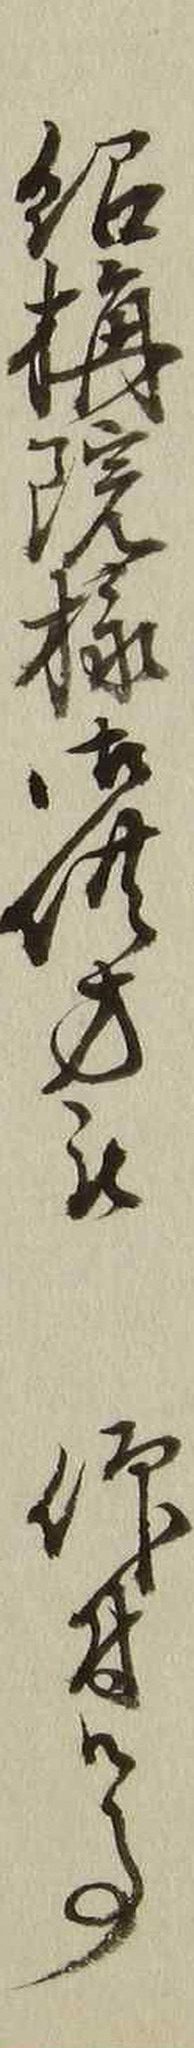紹栴院様御供方被仰付候事
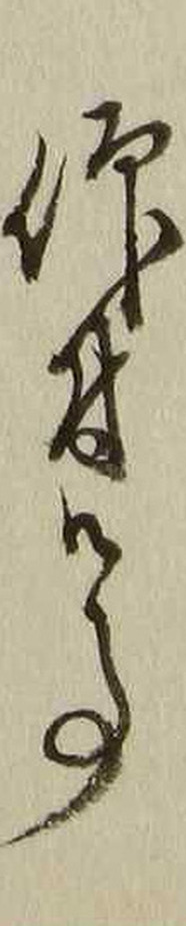仰付候事
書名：諸士系譜　巻之31　い之部31
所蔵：会津若松市立会津図書館
